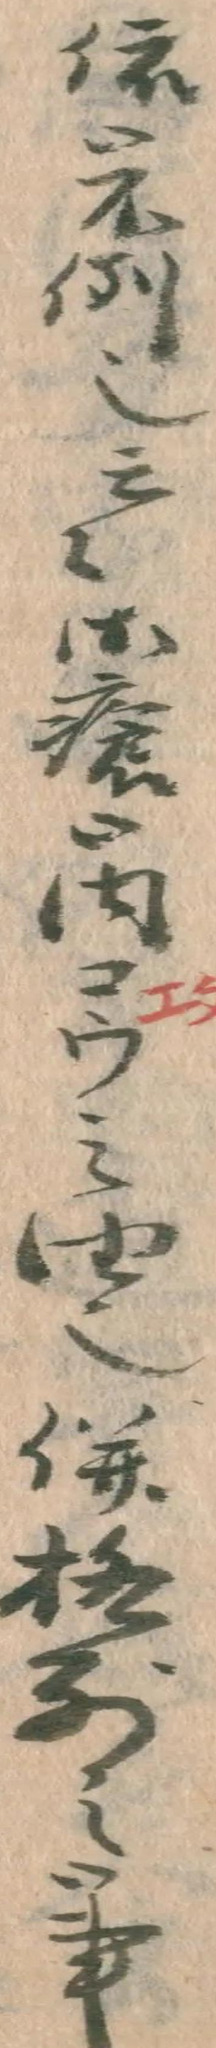依御不例也云々、御瘡御内コウ之由也、併格別之御事
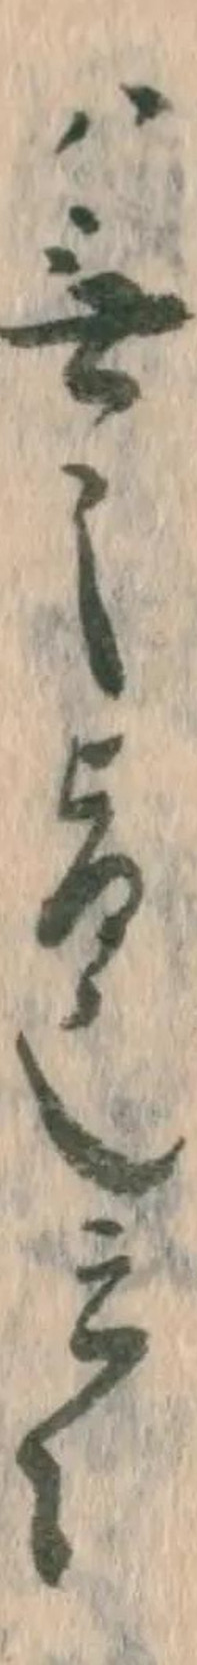ハ無之旨也云々、
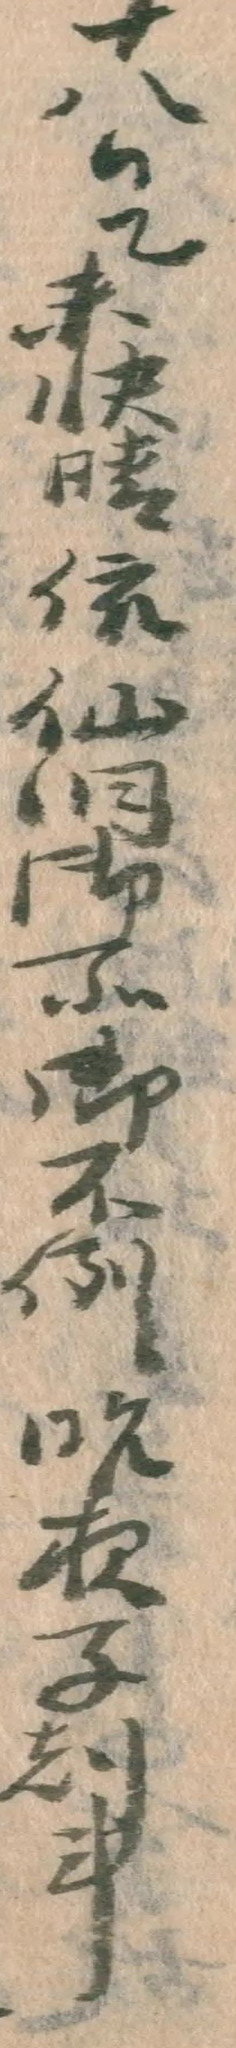十八日乙未快晴、俄仙洞御所御不例、晩夜子刻斗
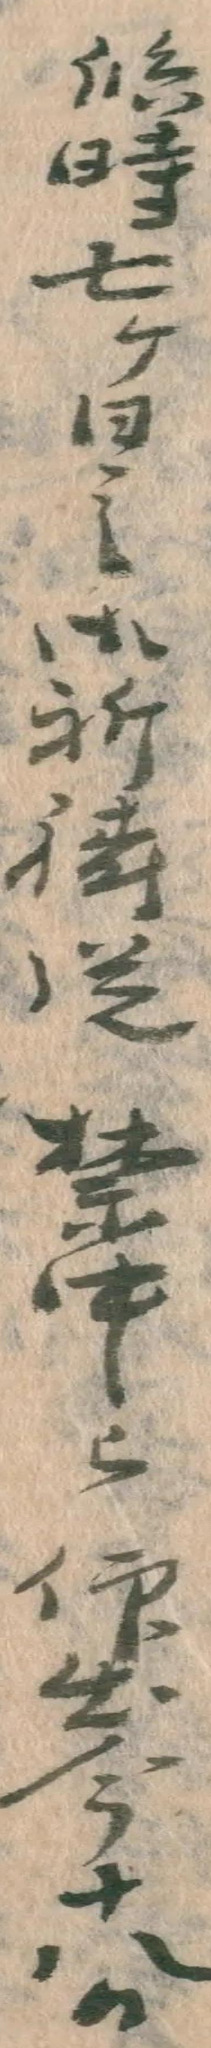臨時七ヶ日之御祈祷、従禁中被仰出、今十八日
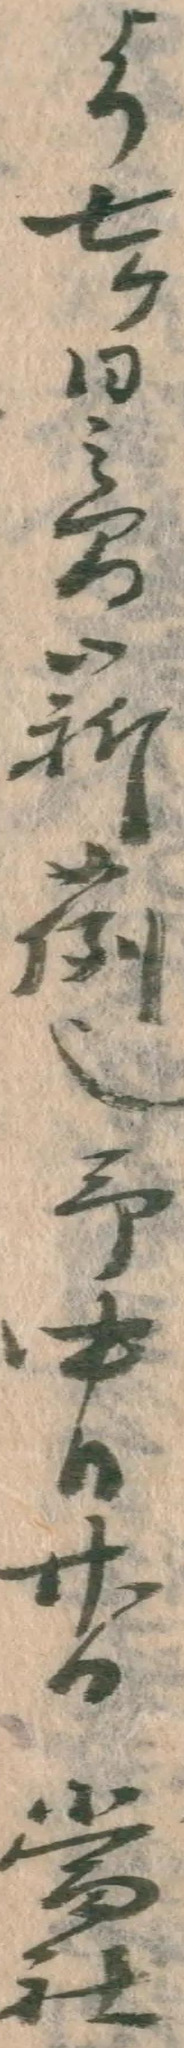より七ヶ日之間御祈御例也、予申日廿日當社
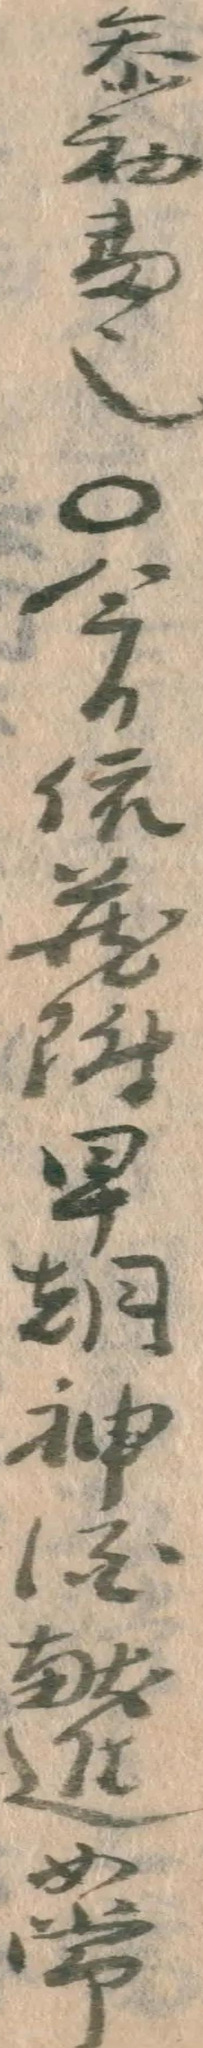参勤番也、○今日依蔵附早朝神酒献進如常、
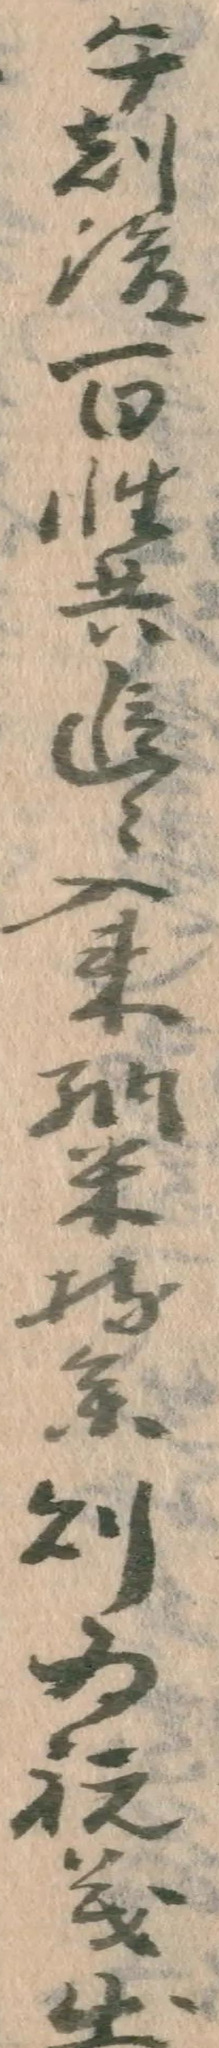午刻後百姓共追々入来、納米持参、則為祝義出
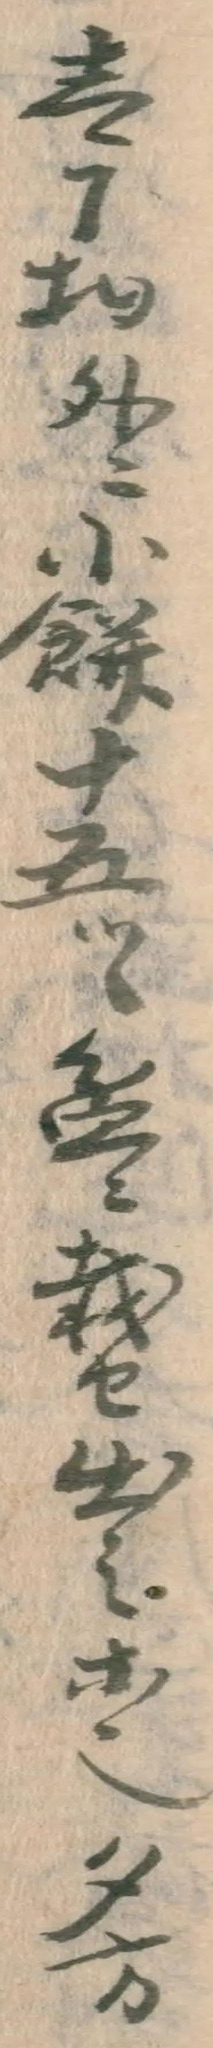壱丁物外二小餅十五ツヽ盆ニ載セ出之等也、夕方
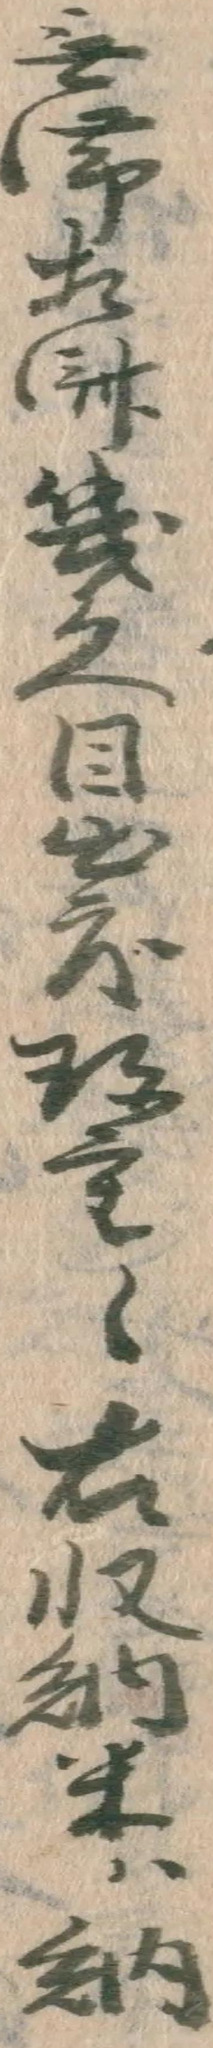無滞相済幾久目出度珍重候、右収納米ハ納
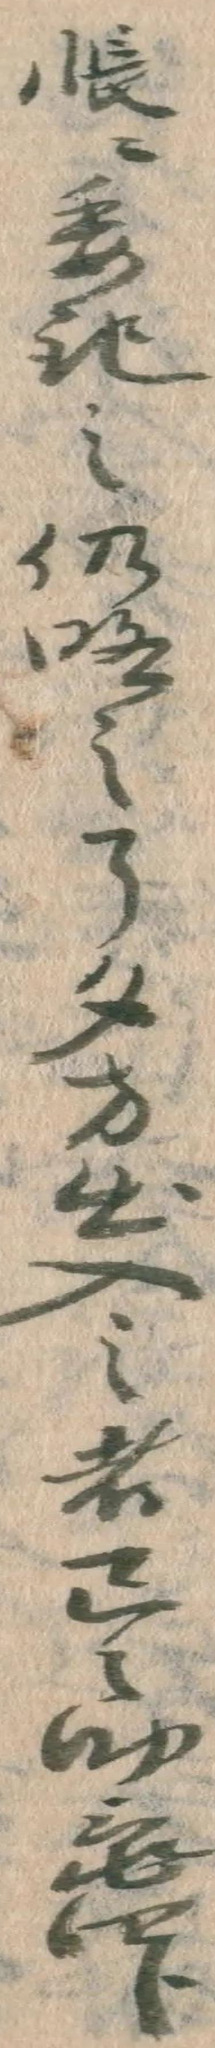帳二委記之、仍略之了、タ方出入之者巳之助・亀四郎
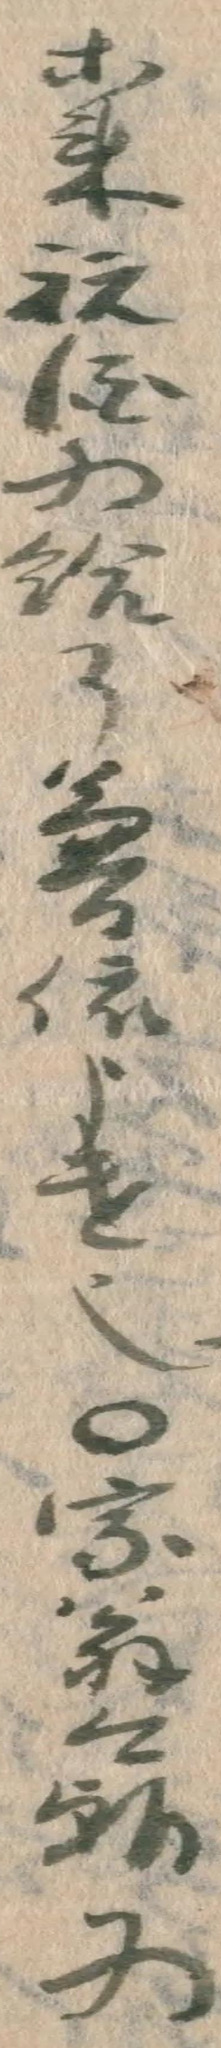等来、祝儀為給了、兼而依申遣也、○家翁今朝為
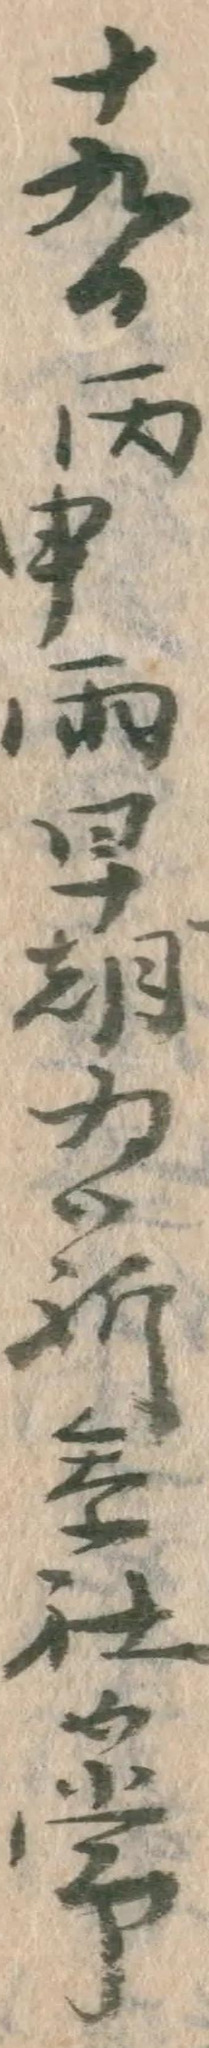十九日丙申雨、早朝為御祈参社如常、
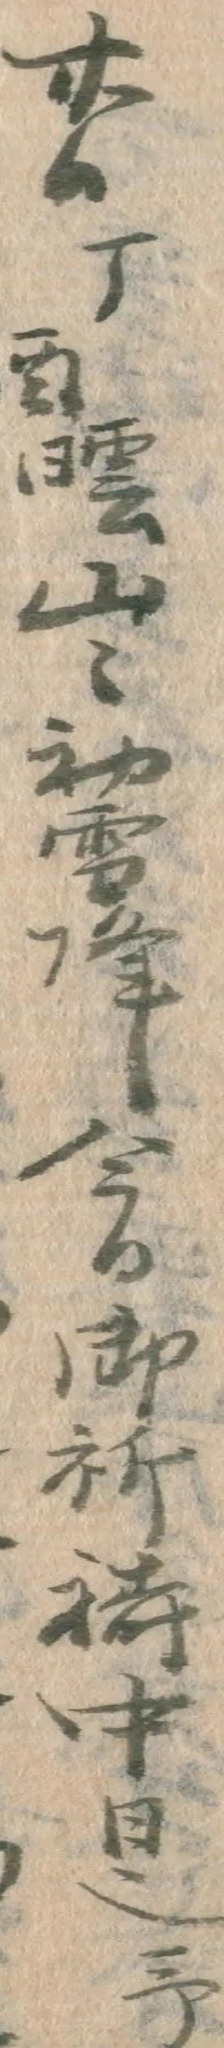廿日丁酉曇、山〻初雪降、今日御祈祷中日也、予
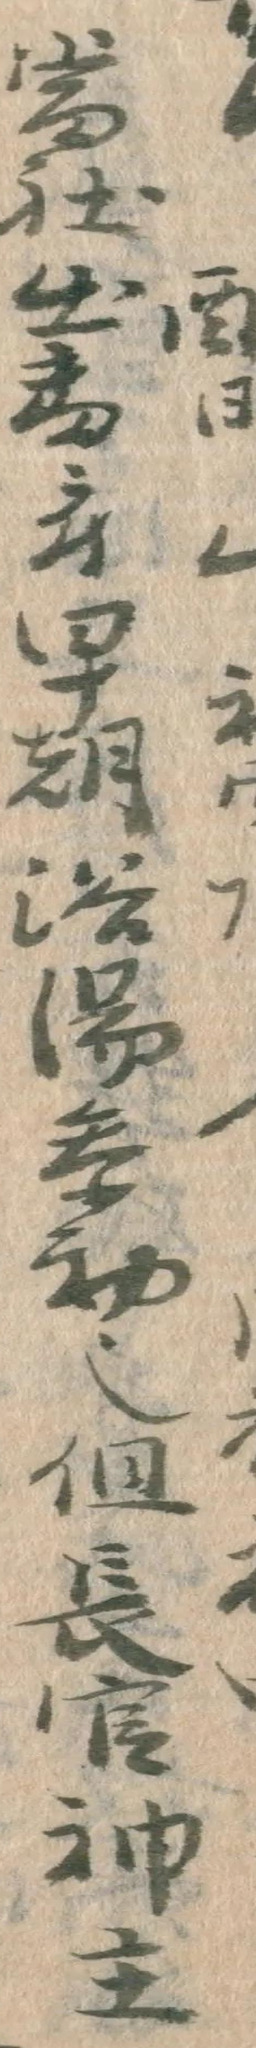當社出番ニ付早朝浴湯参也、但長官神主
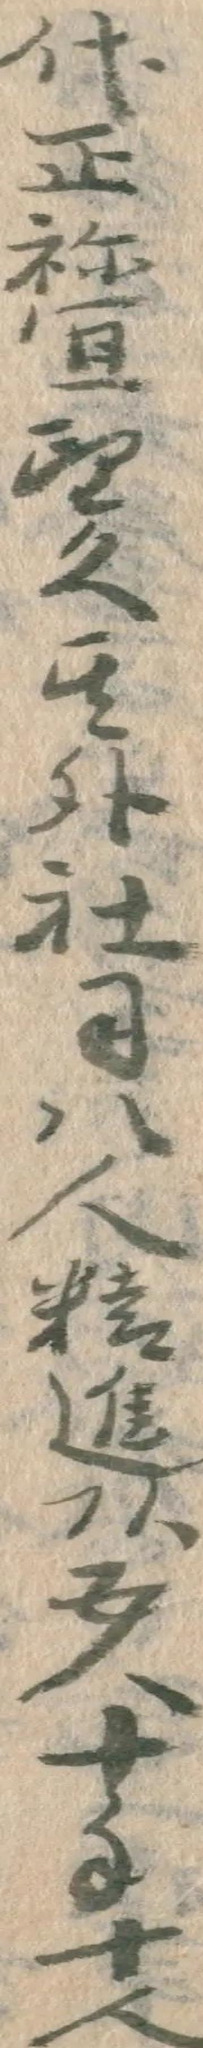代正称宜聖久、其外社司八人・精進頭五人・十手十人
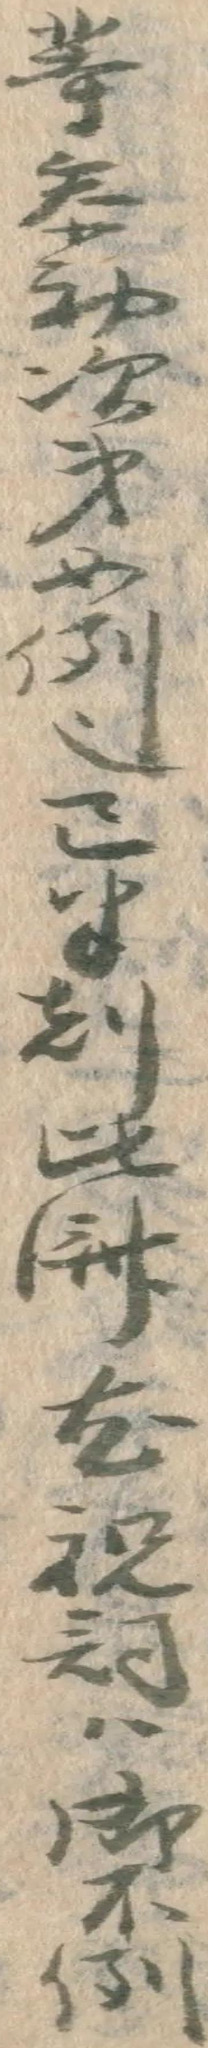等参勤、次第如例也、巳半刻比済、尤祝詞ハ御不例
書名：賀茂社記録. 第63冊
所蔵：国立国会図書館 National Diet Library, JAPAN
